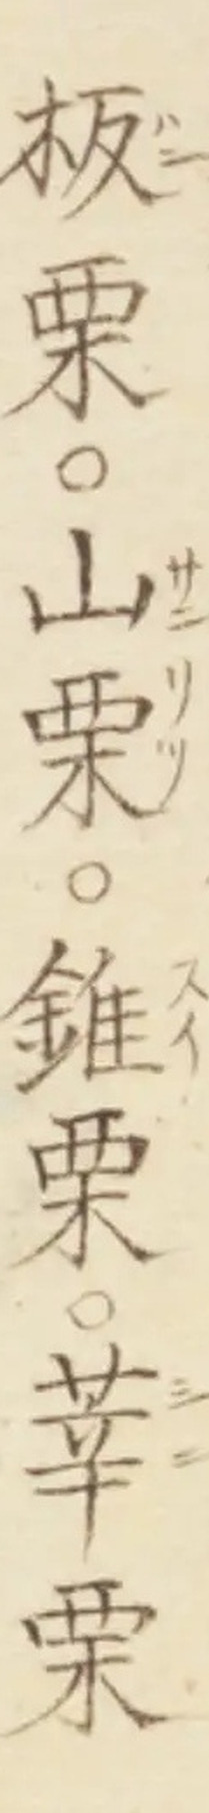板栗〇山栗〇錐栗〇莘栗
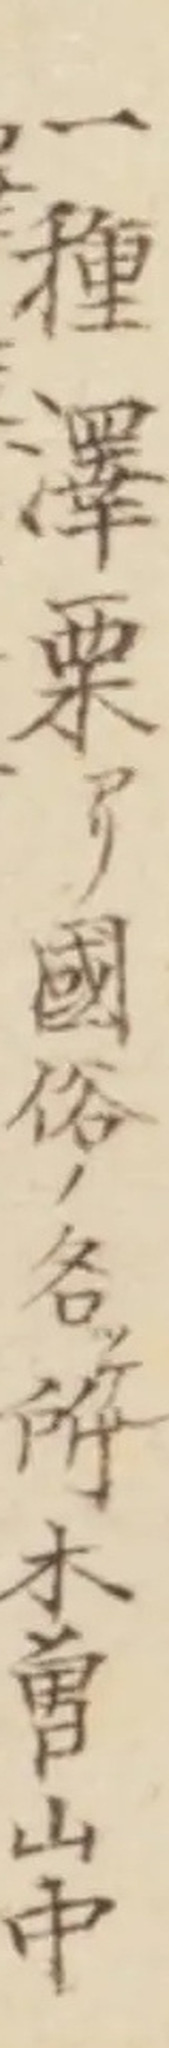一種澤栗あり國俗の名つけ所木曽山中

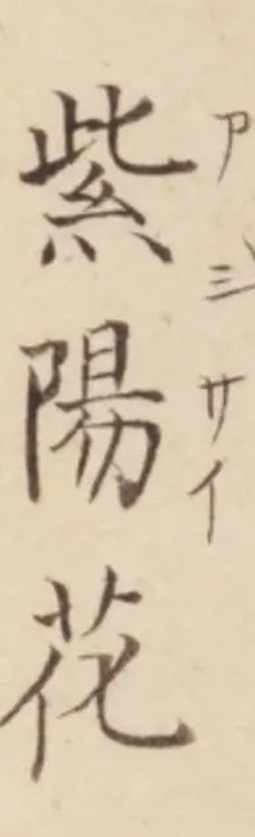紫陽花
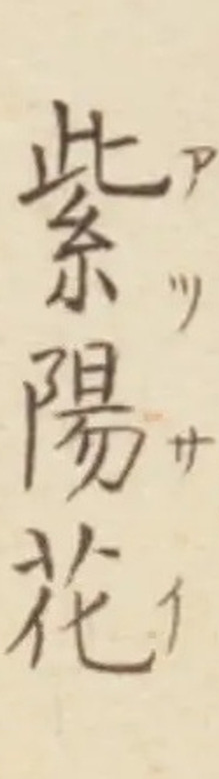紫陽花
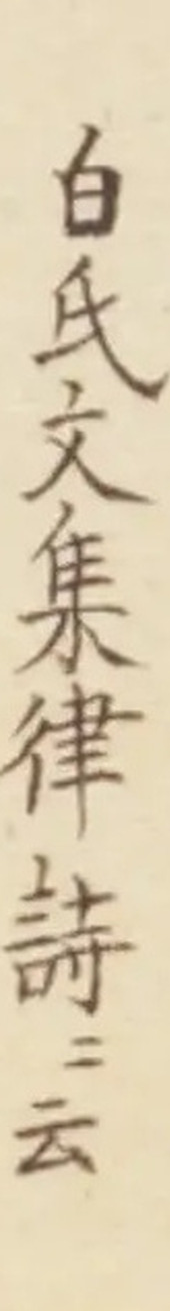白氏文集律詩に云
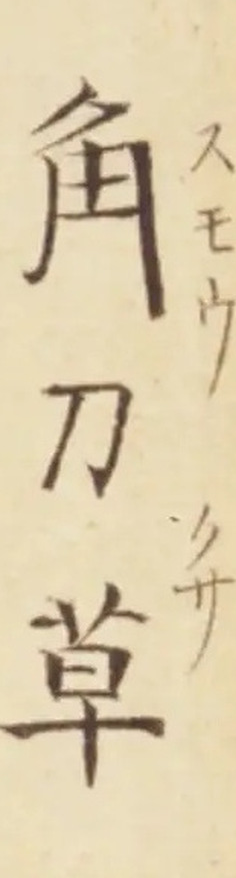角觝草
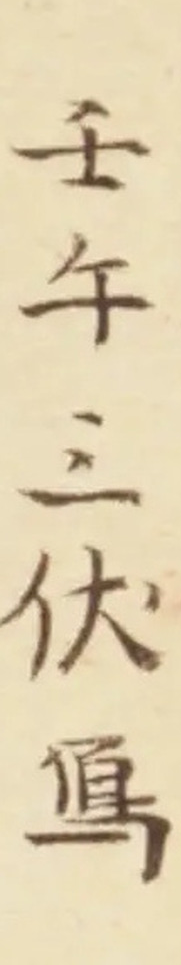壬午三伏寫
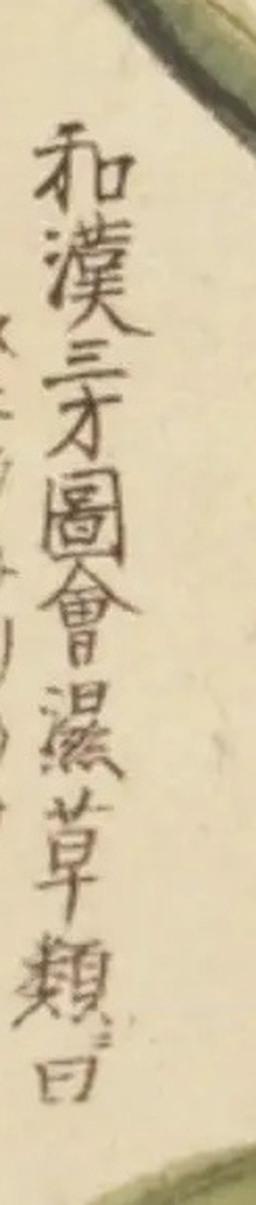和漢三才圖會隰草類に曰
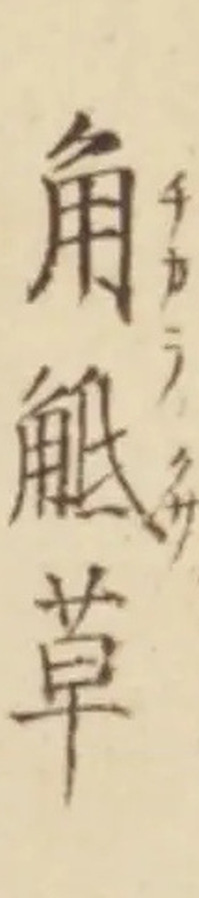角觝草
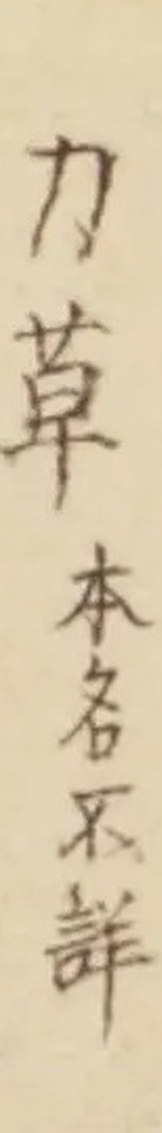刀草本名不詳
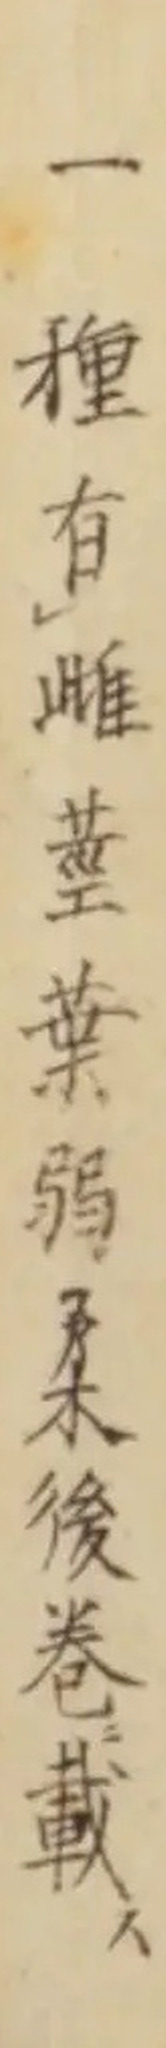一種有雌莖葉弱柔後巻に載す

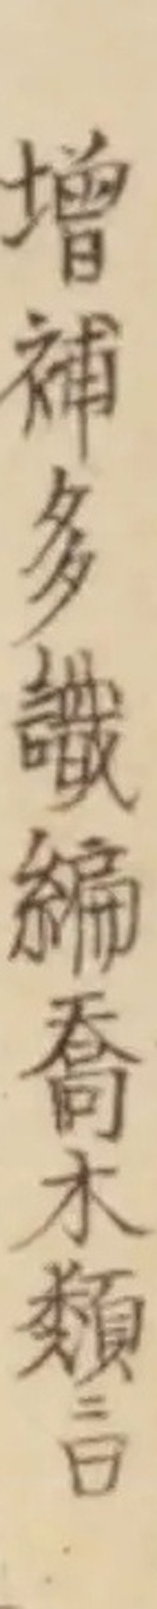増補多識編喬木類に曰
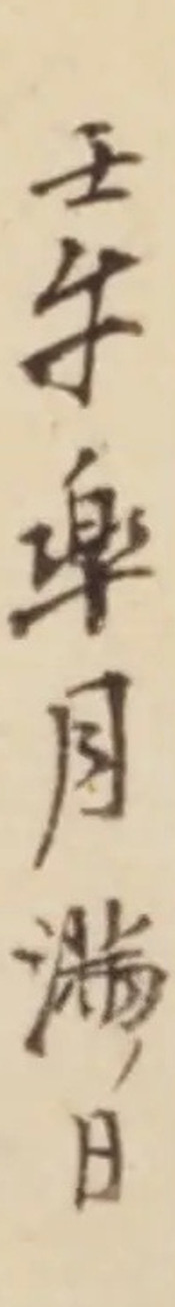壬午皐月満の日
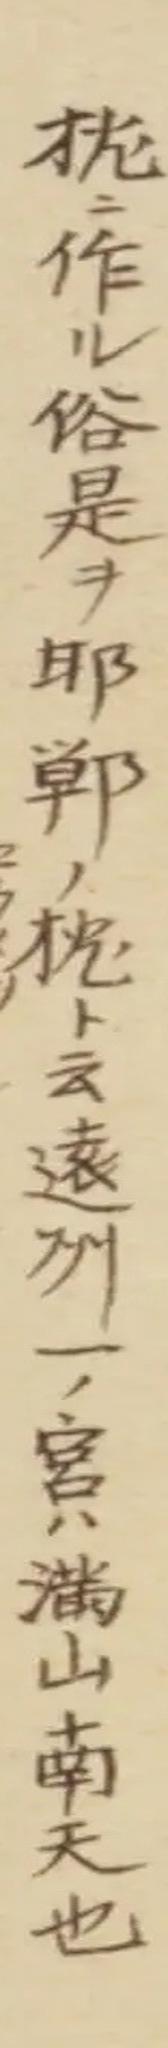枕に作る俗是を耶の枕と云遠州の一の宮は満山南天也
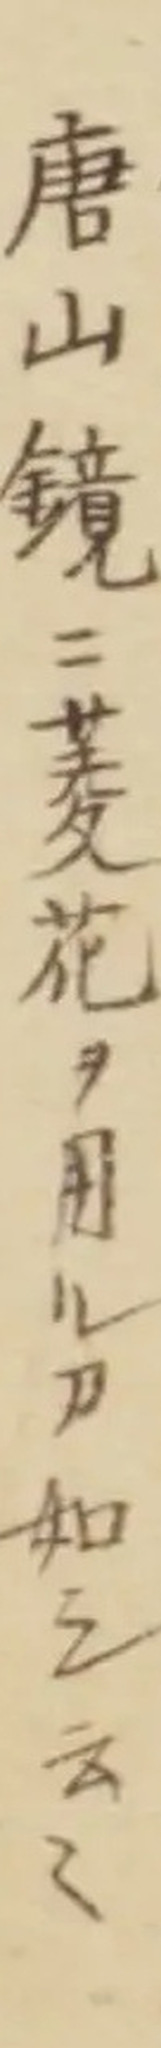唐山鏡に菱花を用るか如し云々

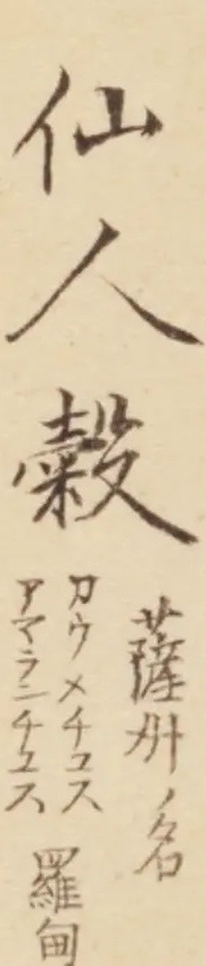仙人穀薩州の名
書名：梅園草木花譜夏之部. 1
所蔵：国立国会図書館 National Diet Library, JAPAN
